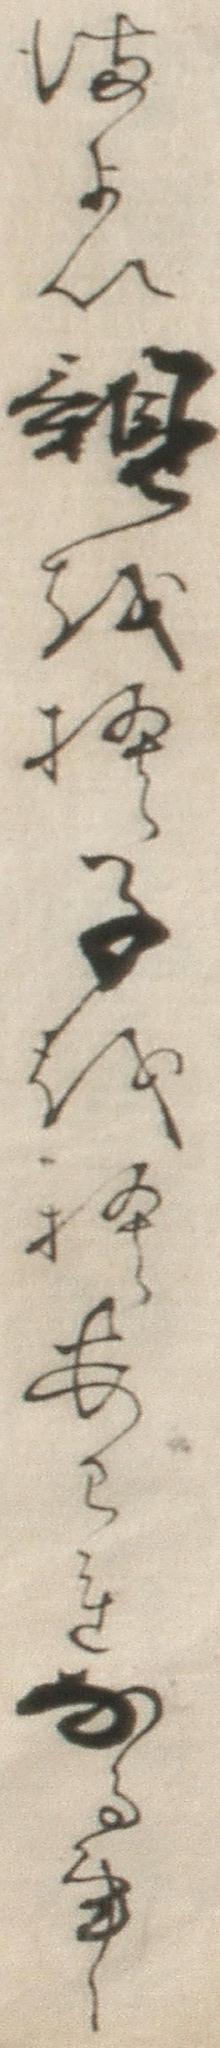まよひ親を捨子を捨あわれなる事
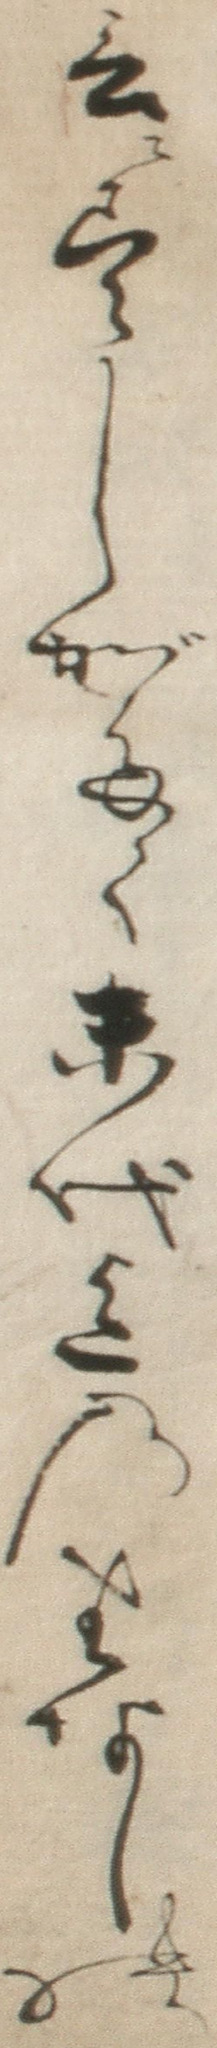言二尽しがたく末代迄のはなしの
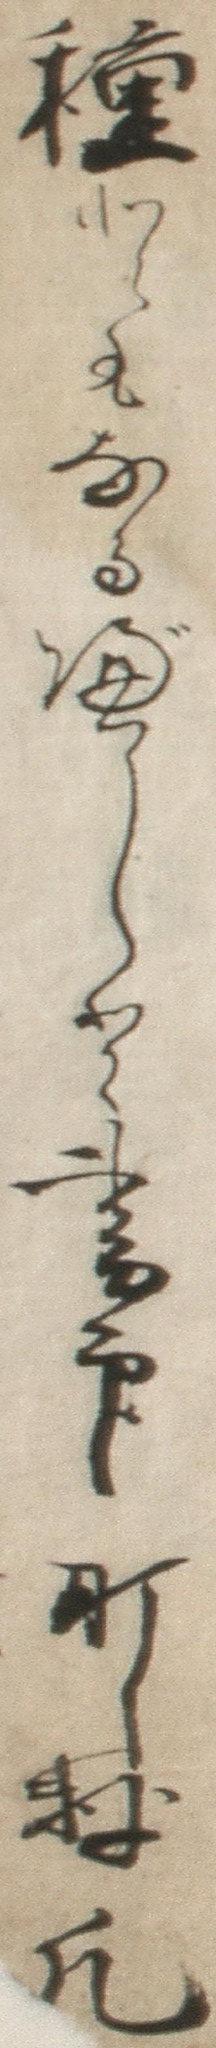種ともなるべしと書印町数凡

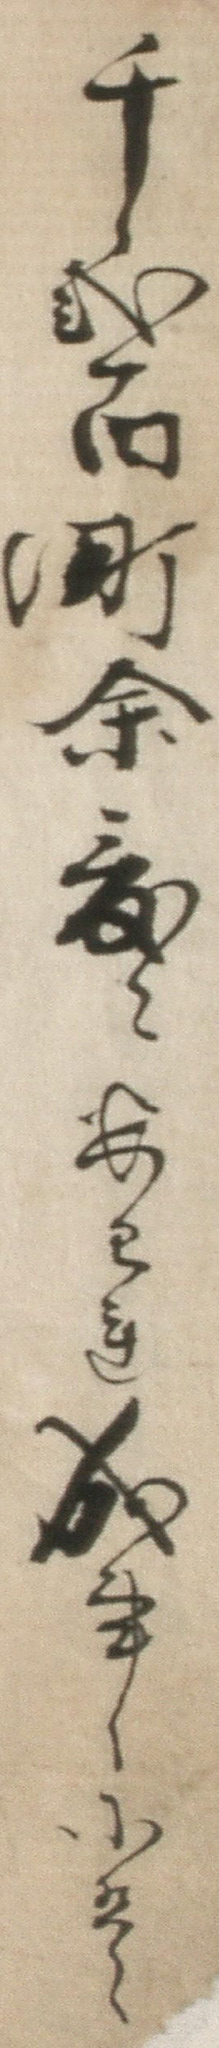千二百町余度々あわれ成事には
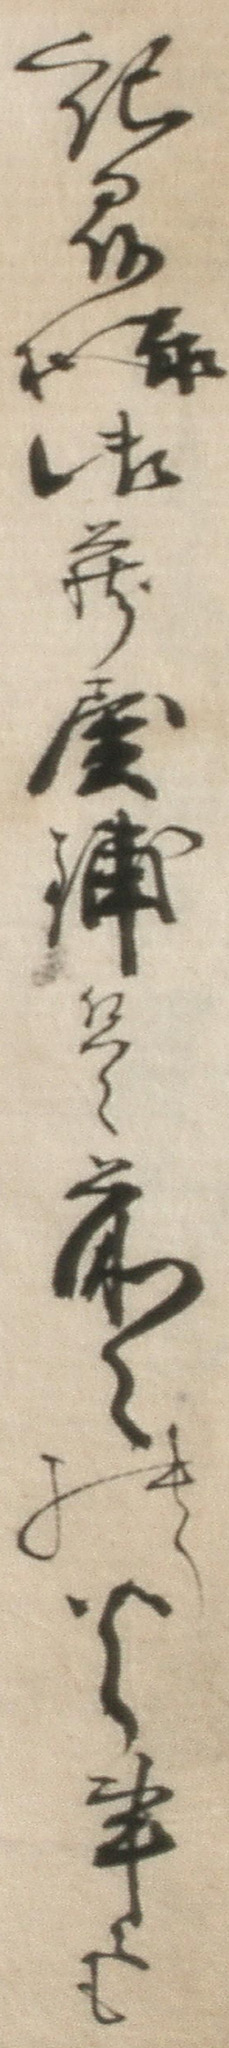紀州様御蔵屋鋪は前々の火事二も
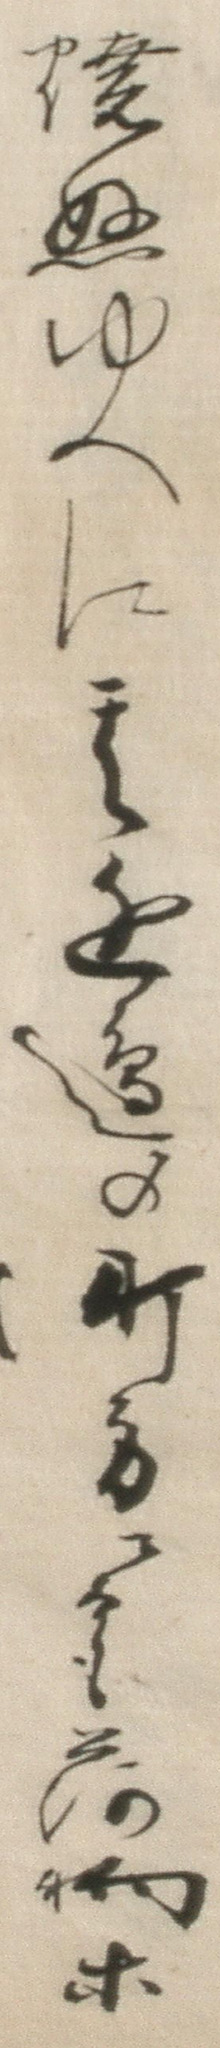焼ぬゆへに其近辺の町方二而も荷物等
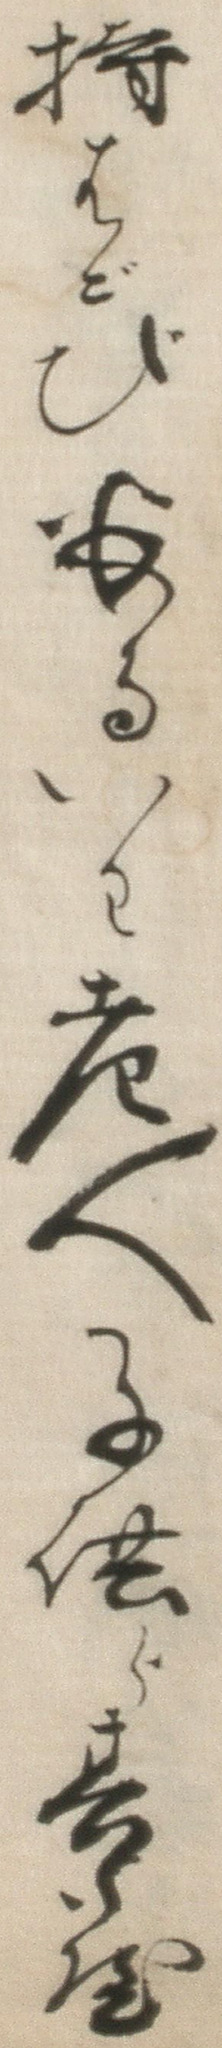持はこびあるいわ老人子供ら其御や
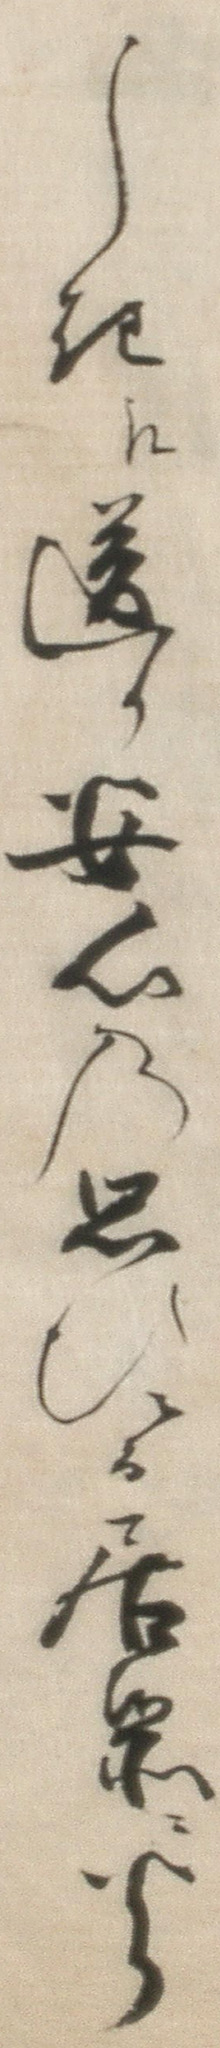しき江送り安心の思ひ二而居候所二火
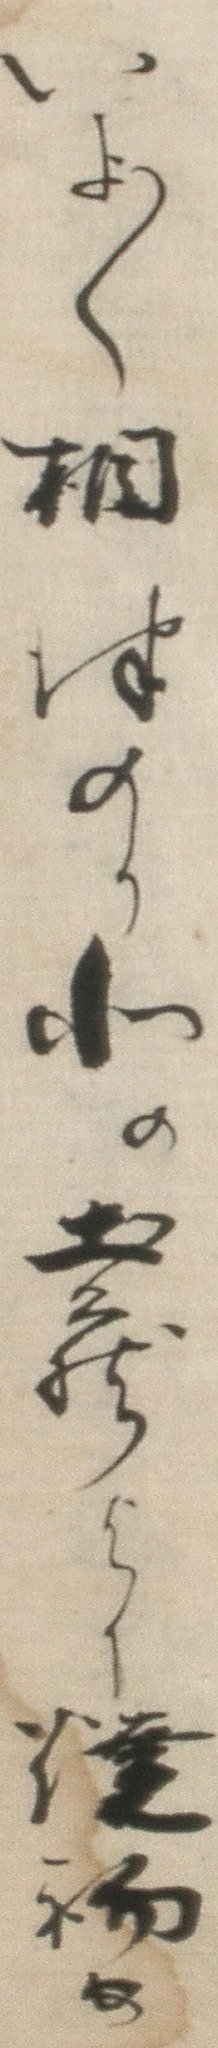いよ〳〵相つのり北の土蔵より焼初め
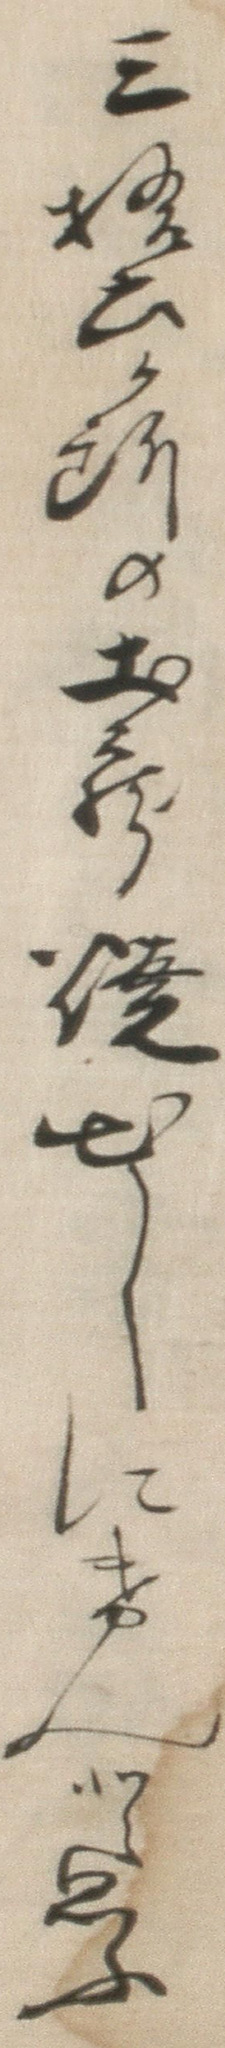三拾六ヶ所の土蔵焼出しにけんと思ふ
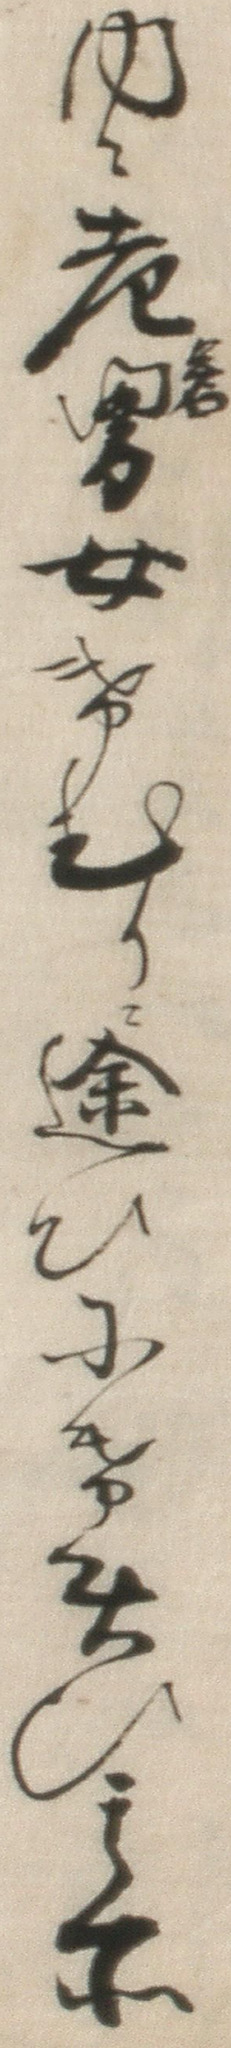内二老若男女けむり二途ひにけ失ひ其所
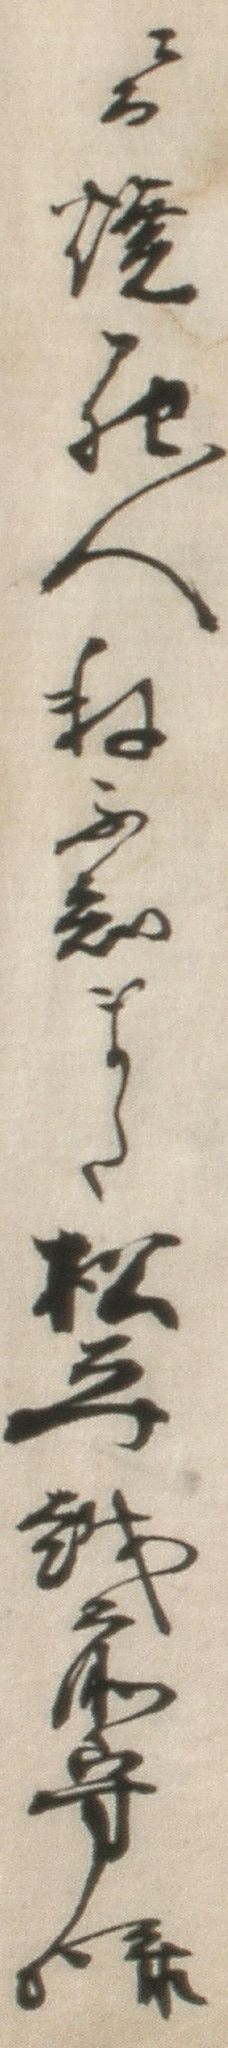二而焼死人数不知また松平越前守様
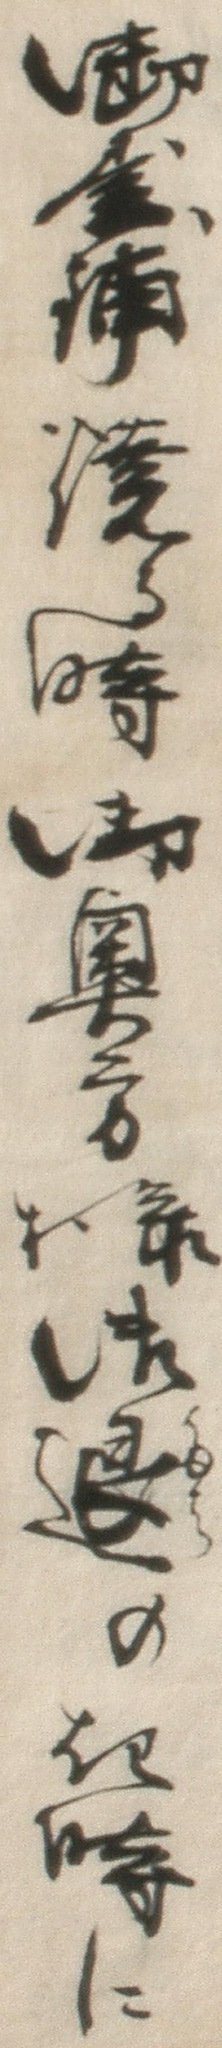御屋鋪焼る時御奥方様御退の起時に
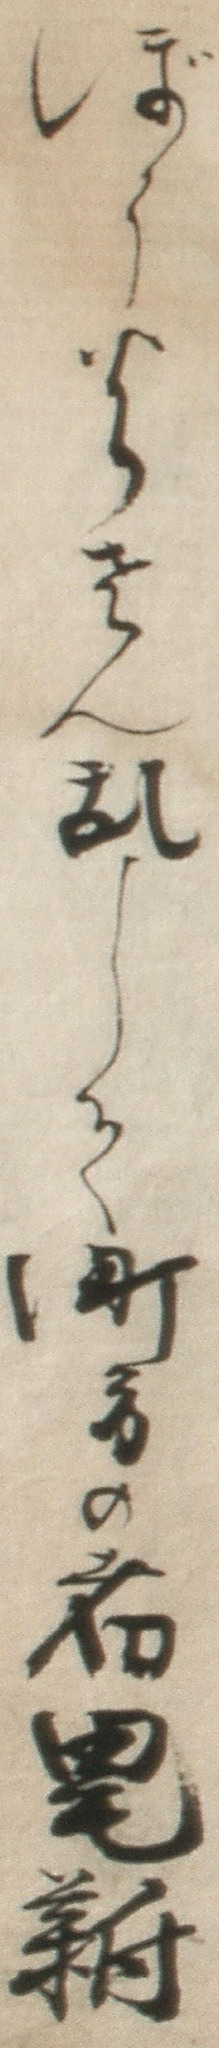ぼゝ火はん乱して町方の者見難
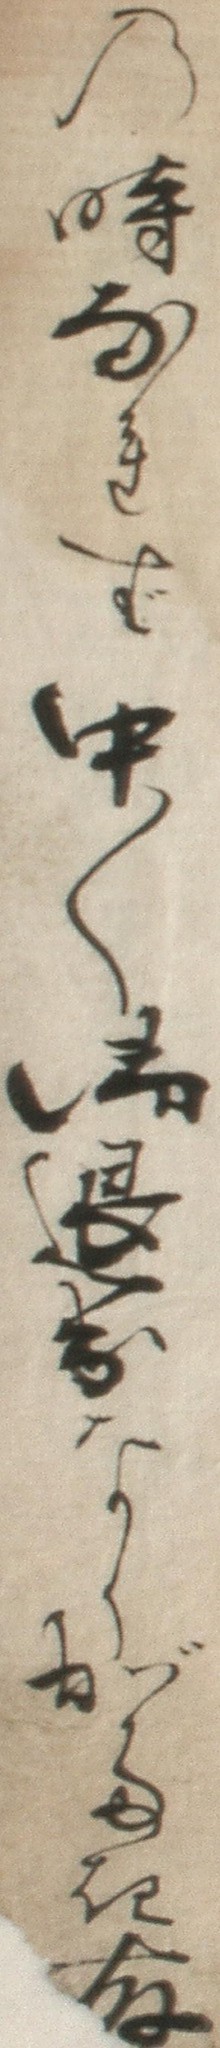の時なれば中々御退出なりがたき故

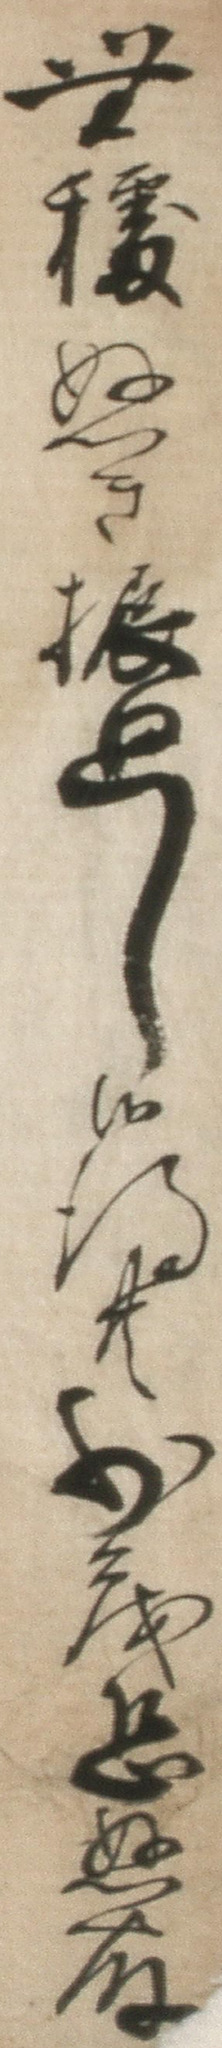無拠ぬき振廻し候得共少も恐ぬ故
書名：文政十二丑としの類焼場所附
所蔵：東京大学地震研究所図書室 Earthquake Research Institute Library, The University of Tokyo, JAPAN
